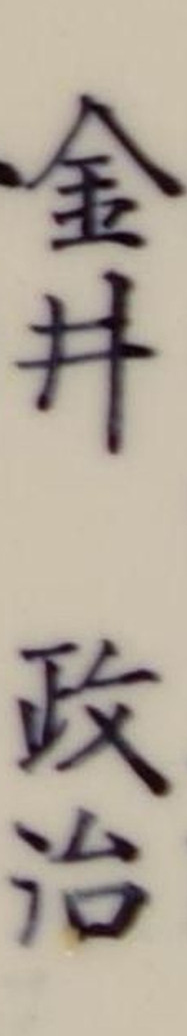金井政治
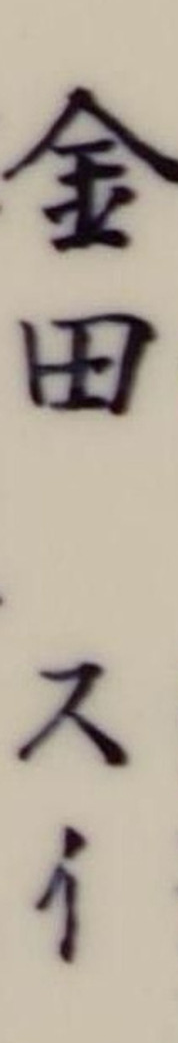金田スイ
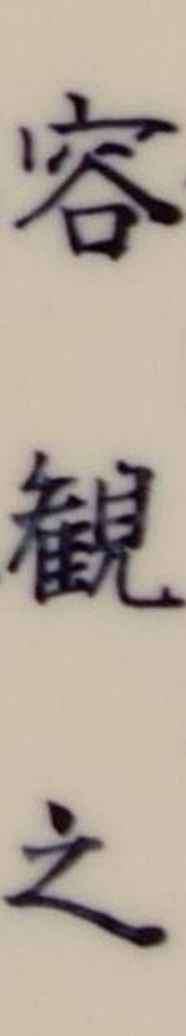容観之
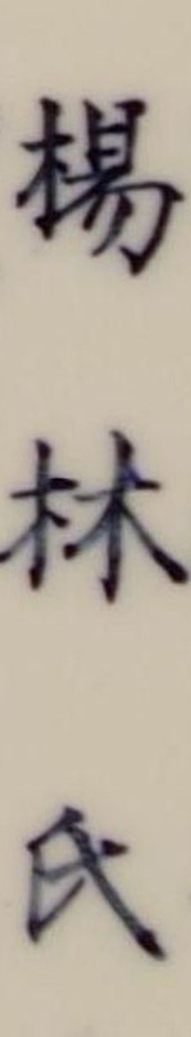楊林氏
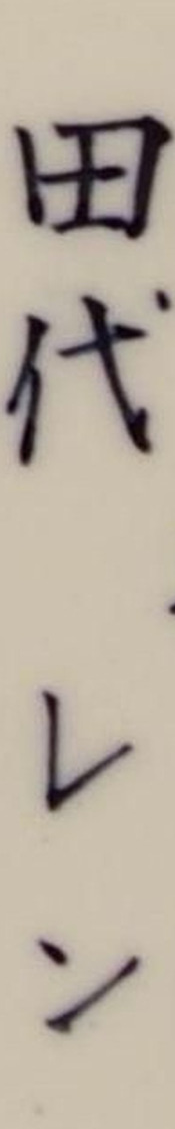田代レン
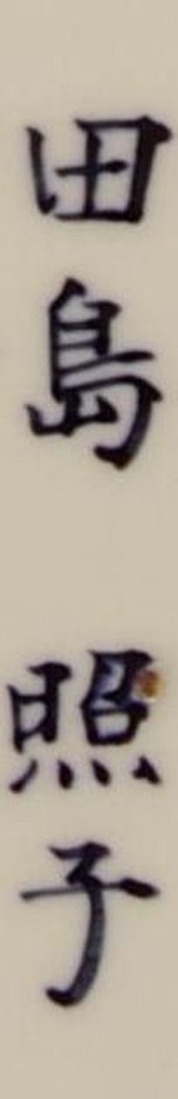田島照子
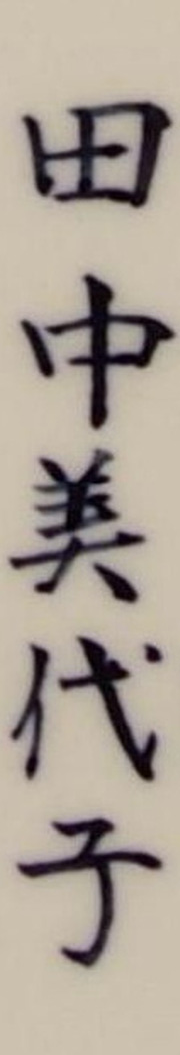田中美代子
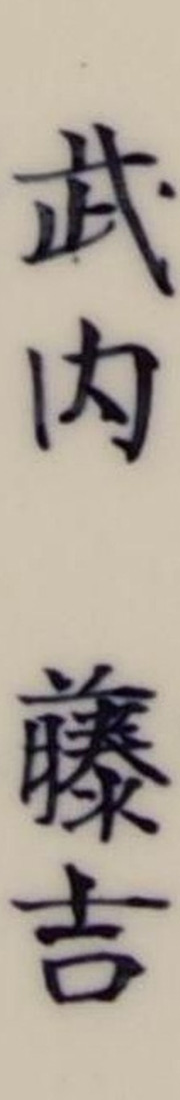武内藤吉
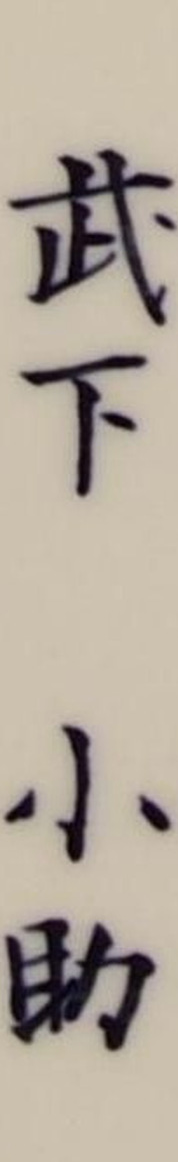武下小助
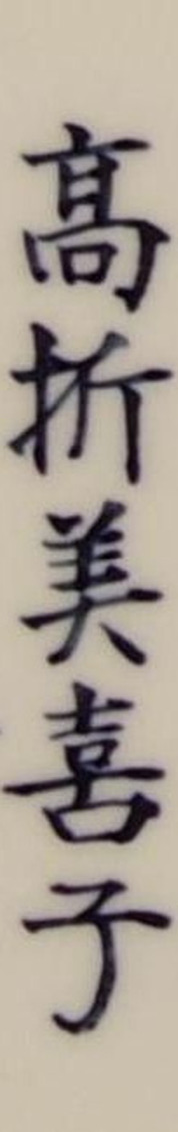髙折美喜子
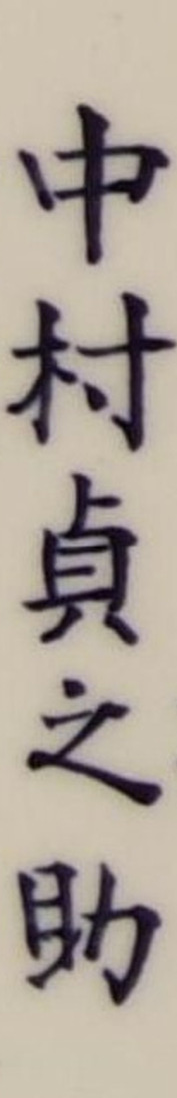中村貞之助
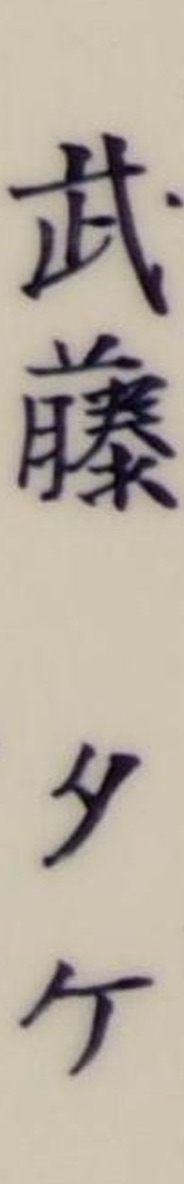武藤夕ケ
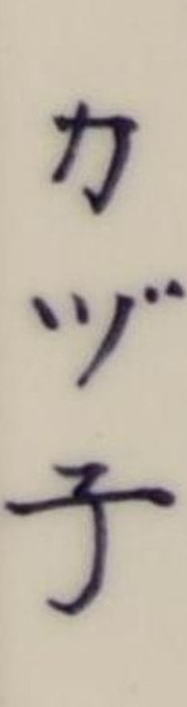カヅ子

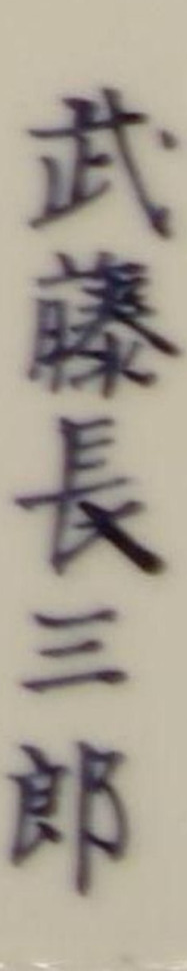武藤長三郎
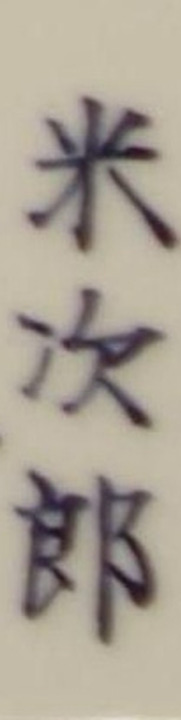米次郎
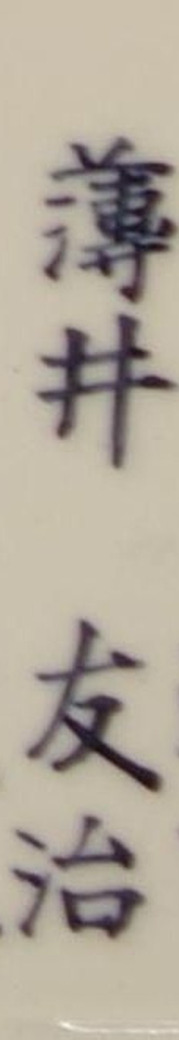薄井友治
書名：M~S
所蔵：高野山金剛峯寺
